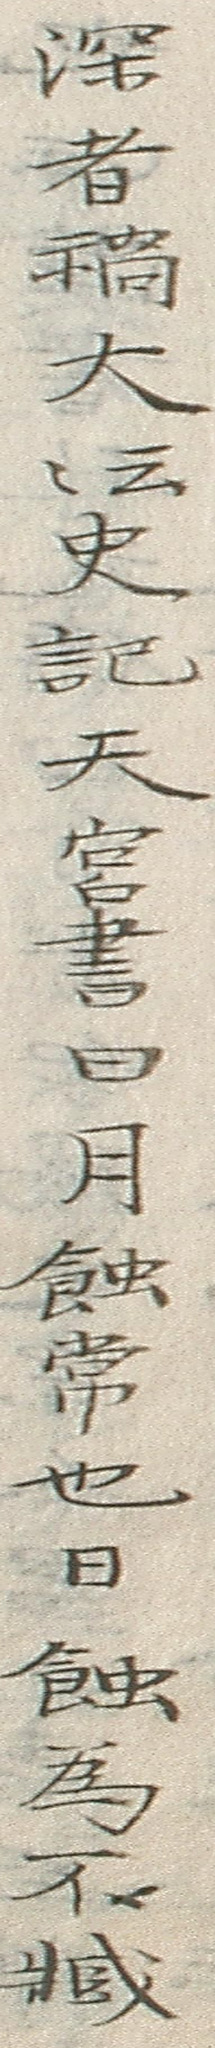深者禍大云〻史記天官書曰月蝕常也日蝕為不臧

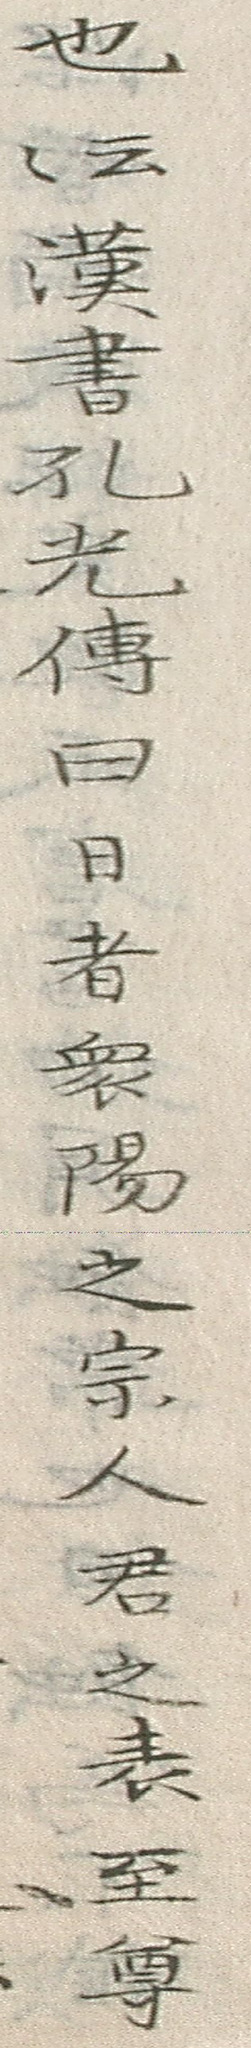也云〻漢書孔光伝曰日者衆陽之宗人君之表至尊
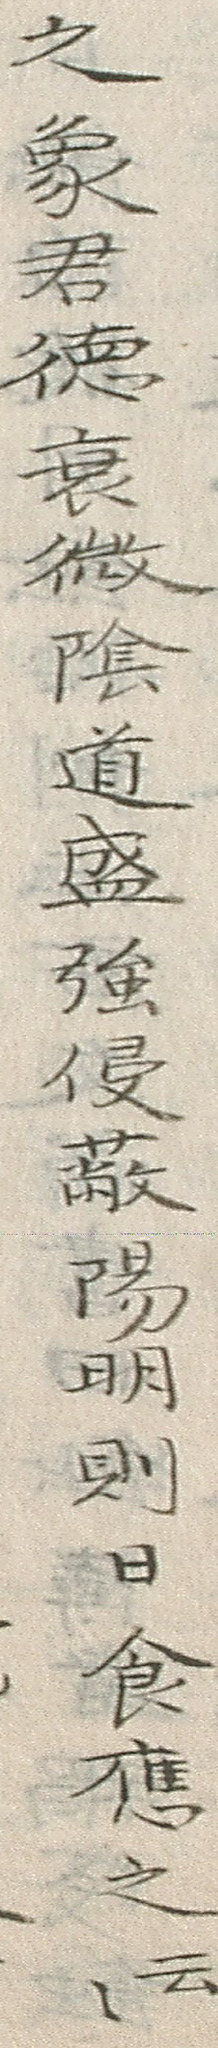之象君徳衰微陰道盛強侵蔽陽明則日食応之云〻
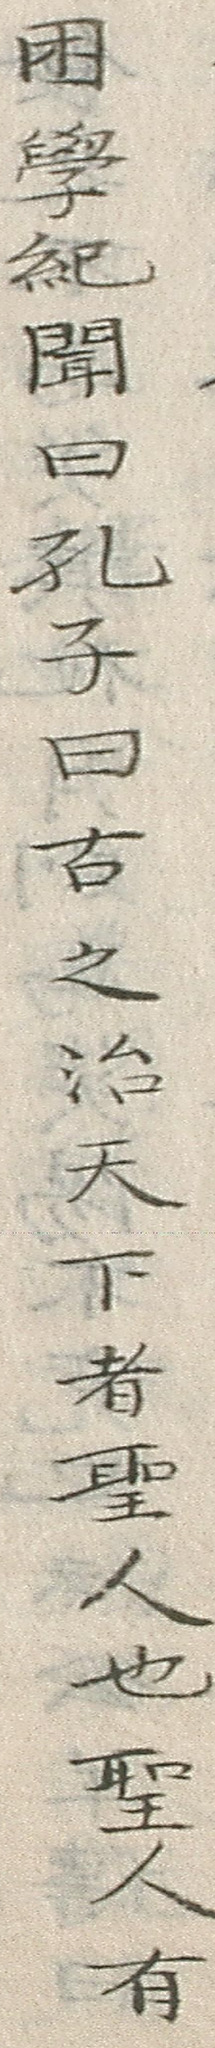困学紀聞曰孔子曰古之治天下者聖人也聖人有
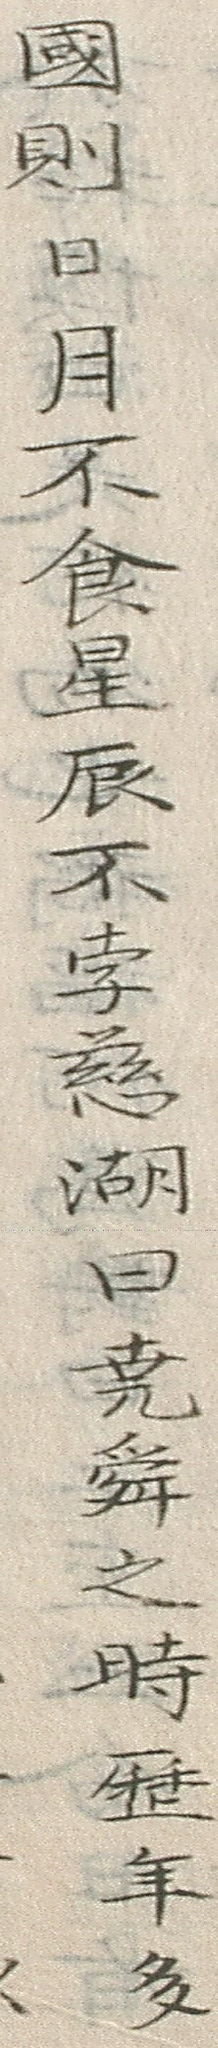国則日月不食星辰不孛慈湖曰尭舜之時歴年多
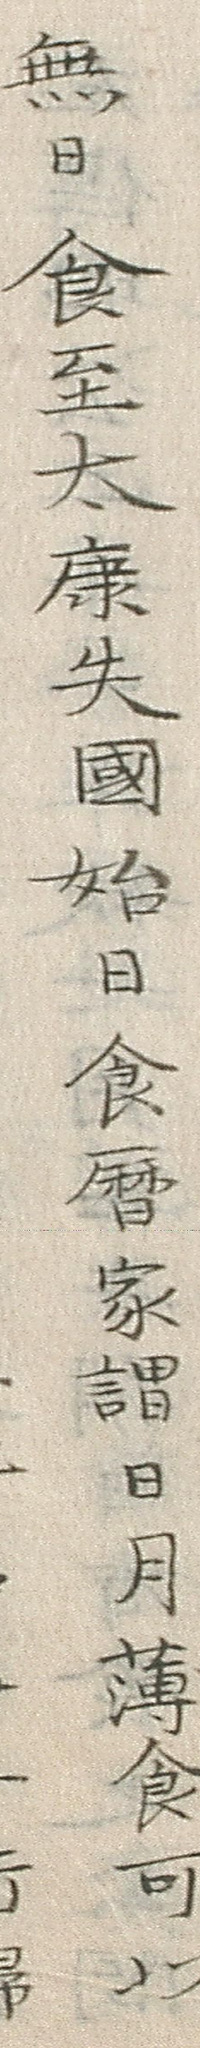無日食至太康失国始日食暦家謂日月薄食可以
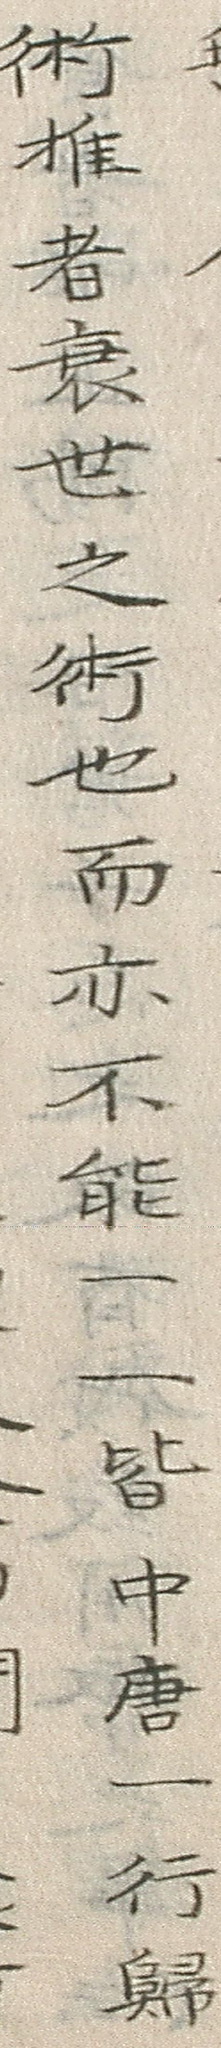術推者衰世之術也而亦不能一一皆中唐一行帰
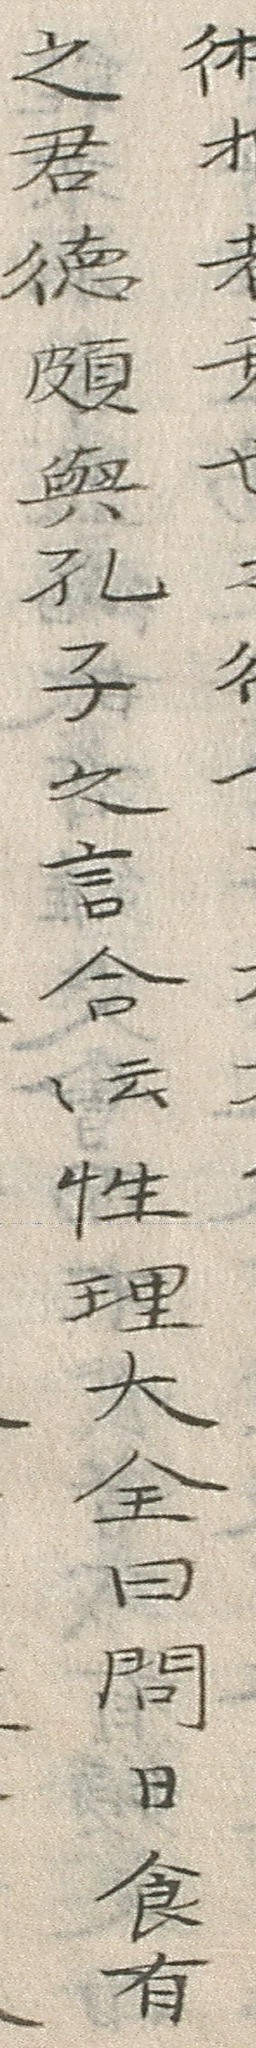之君徳頗与孔子之言合云〻性理大全曰問日食有
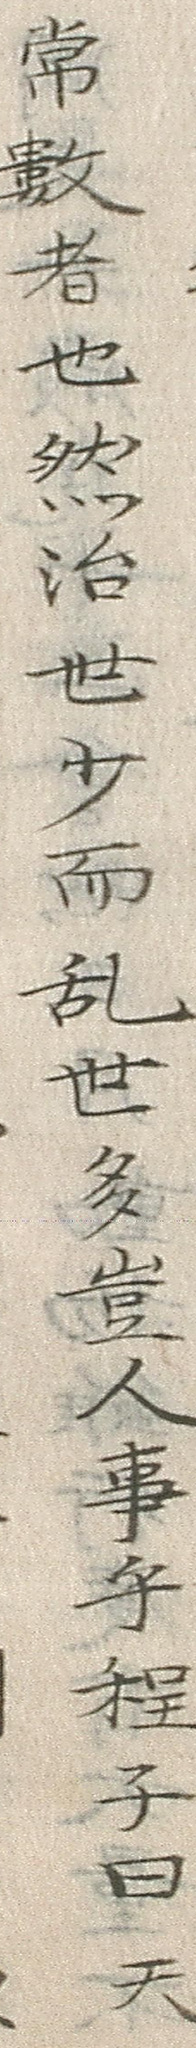常数者也然治世少而乱世多豈人事乎程子曰天
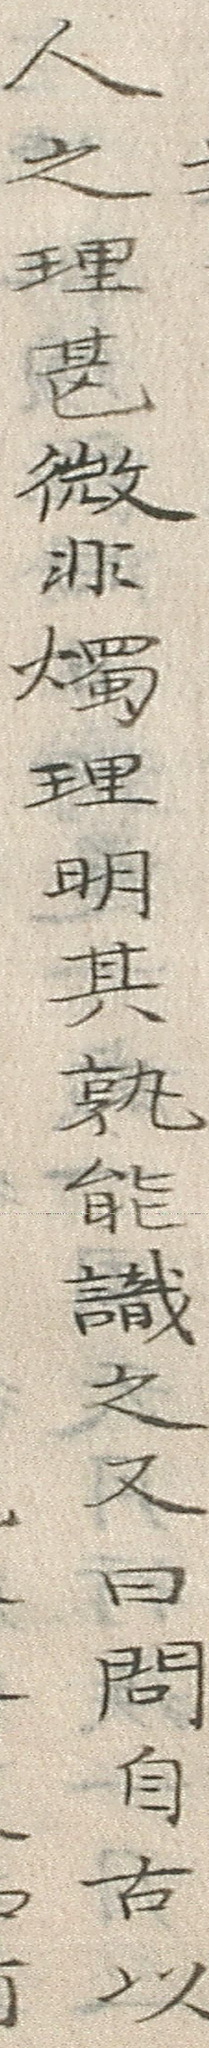人之理甚微非燭理明其孰能識之又曰問自古以
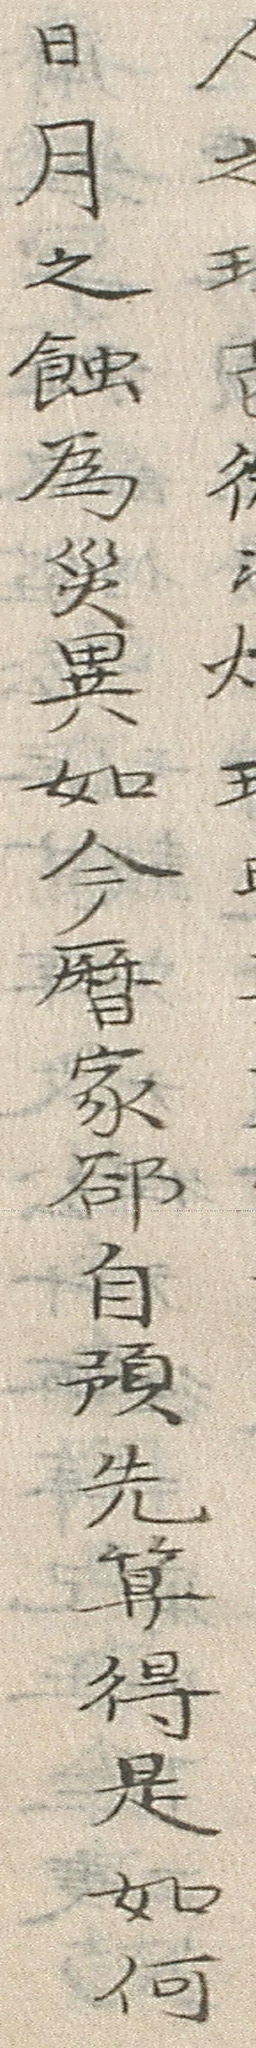日月之蝕為災異如今暦家郤自預先算得是如何
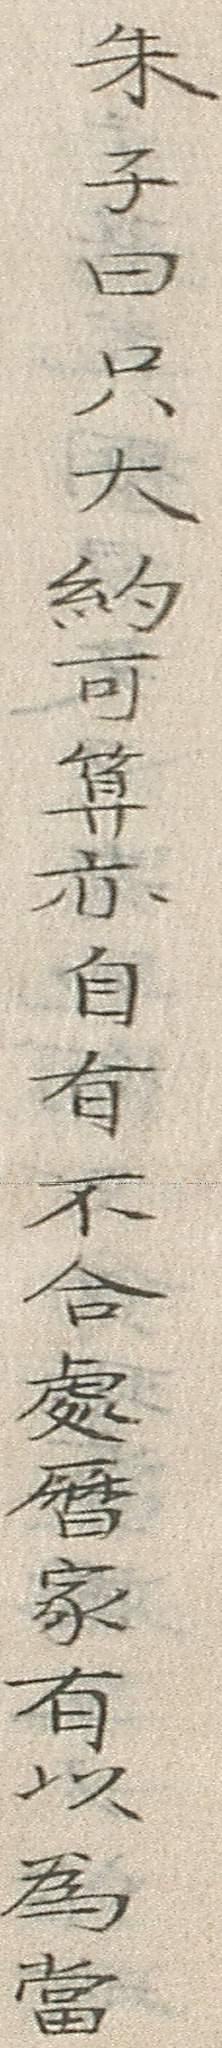朱子曰只大約可算亦自有不合処暦家有以為当
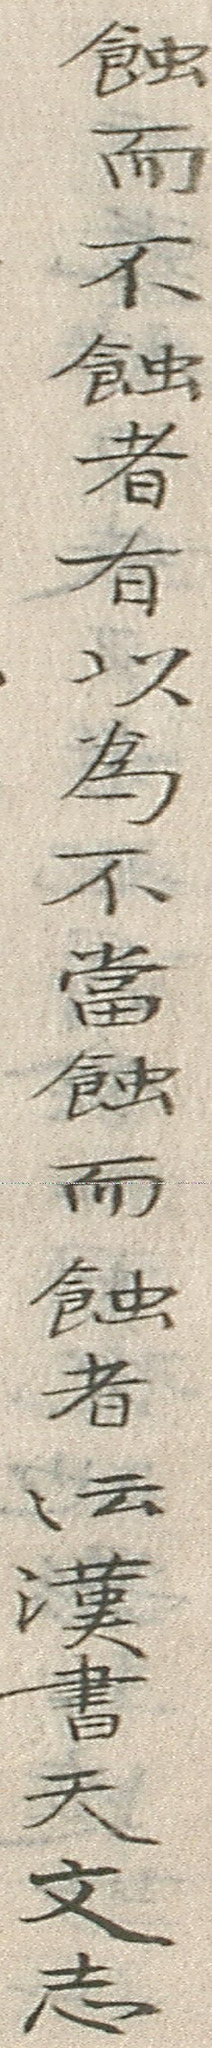蝕而不蝕者有以為不当蝕而蝕者云〻漢書天文志
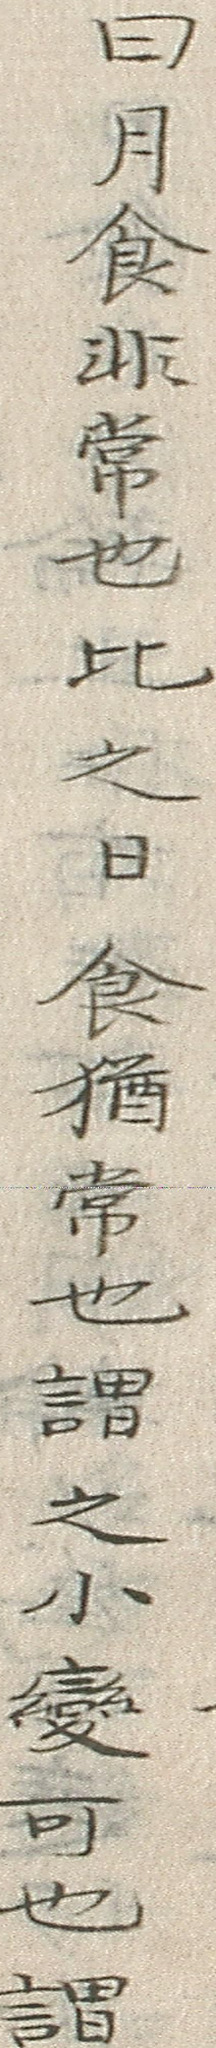曰月食非常也比之日食猶常也謂之小変可也謂
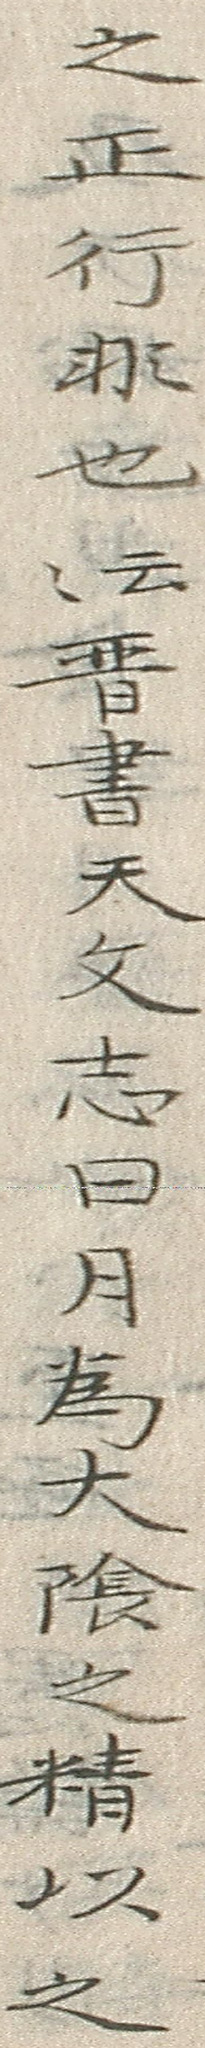之正行非也云〻晋書天文志曰月為大陰之精以之
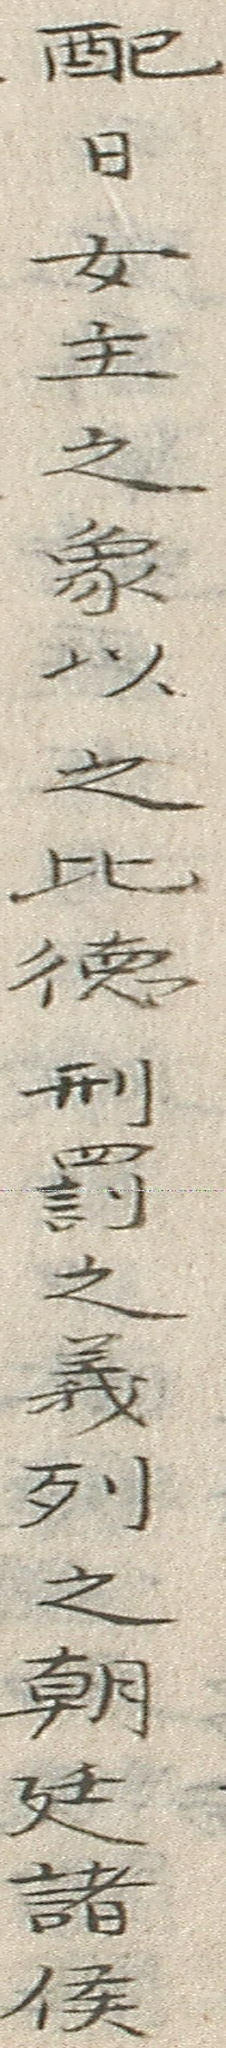配日女主之象以之比徳刑罰之義列之朝廷諸侯
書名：天學略名目羽翼　全
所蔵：東京大学地震研究所図書室 Earthquake Research Institute Library, The University of Tokyo, JAPAN
